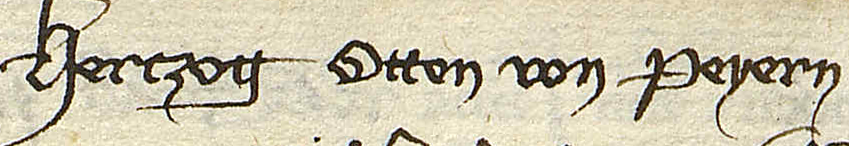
Hercʒog Otten von Peyern
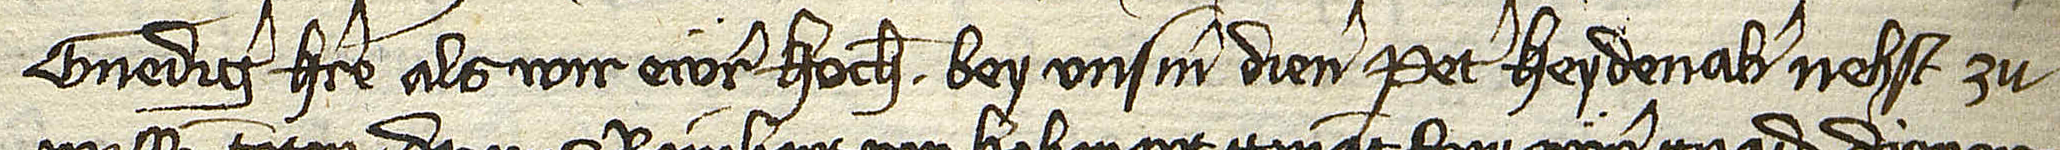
Gnedig* h*re als wir ewr* Hoch* . bey vnſ*m dien* Pet* heydenab* nehſt ʒu
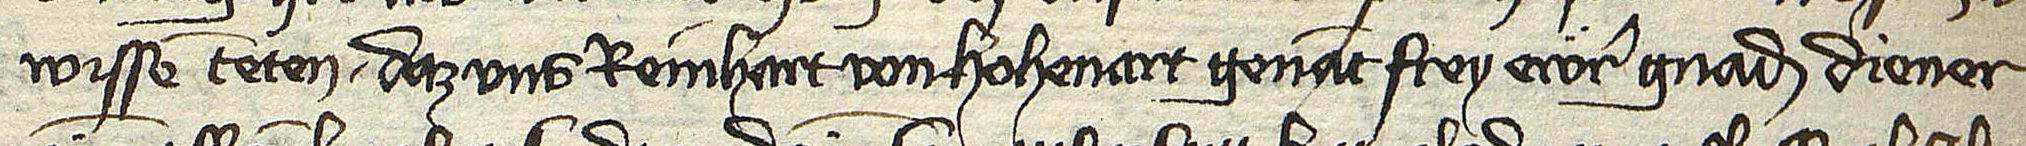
wiſſe* teten . daʒ vns Reinhart von hohenart gena*t frey ewr gnad* diener
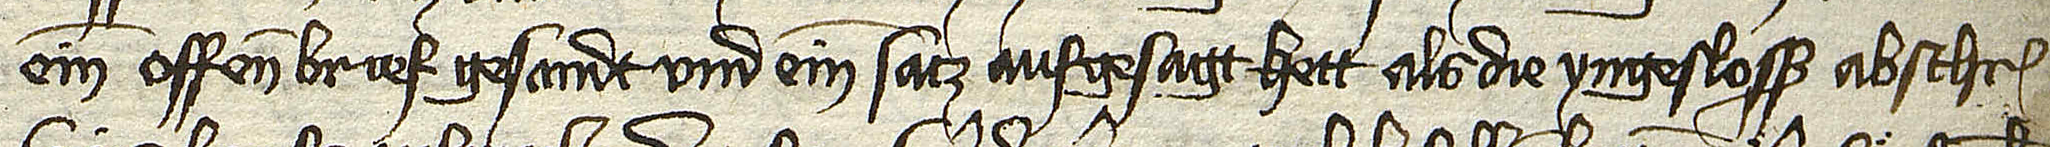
ein* offen* brief geſandt vnd ein* ſacʒ aufgeſagt hett als die yngeſloſſ* abſchr*
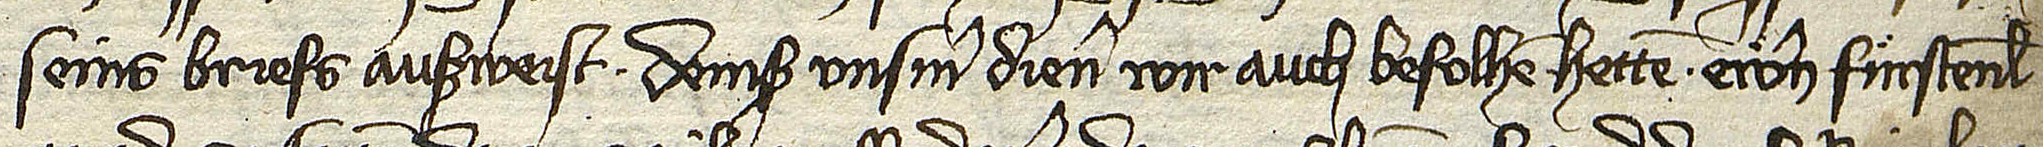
ſeins briefs auſʒweiſt . Demſ* vnſ*m dien* wir auch befolhe* hette* . ew*n fürſtenl*
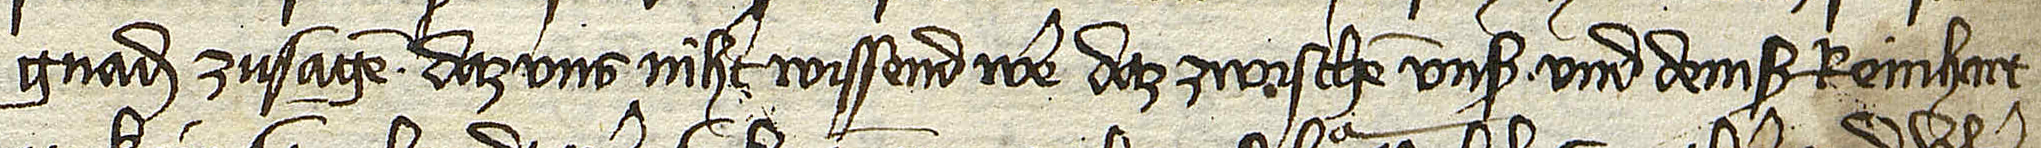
gnad* ʒuſage* . daʒ vns niht wiſſend we* daʒ ʒwiſche* vnſ* . vnd demſ* Reinhart
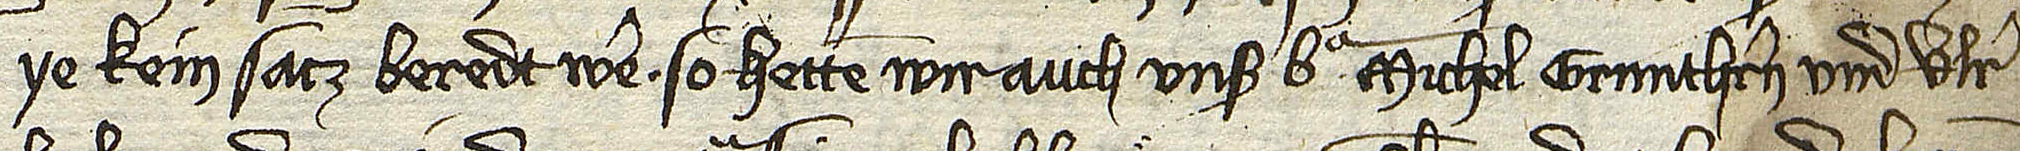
ye kein ſacʒ beredt we* . ſo hette* wir auch vnſ* b* . Michel Grunth*rn vnd Vlr*
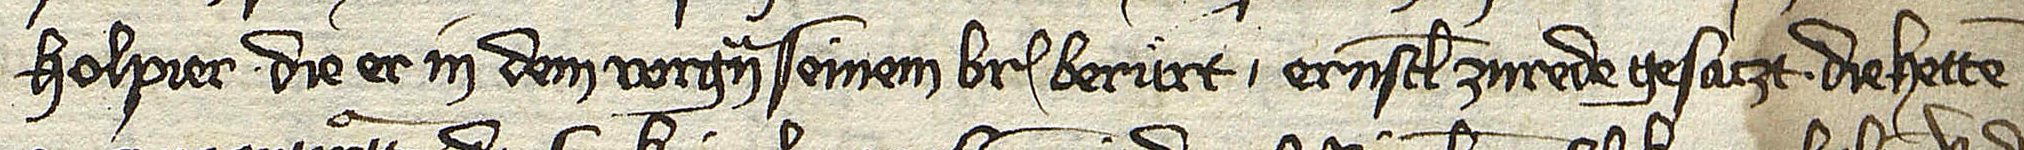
Holpier . die er in dem vorg*n ſeinem br* berürt / ernſtl* ʒurede geſacʒt . die hette*
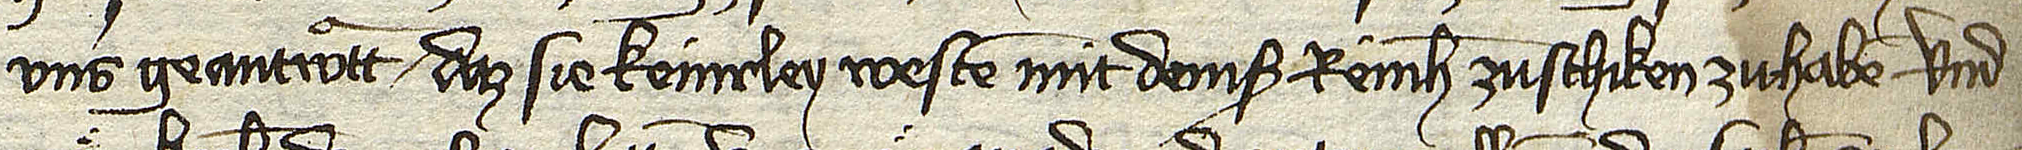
vns geantw*tt / daʒ ſie keinrley weſte* mit demſ* Reinh* ʒuſchiken ʒu habe* Vnd
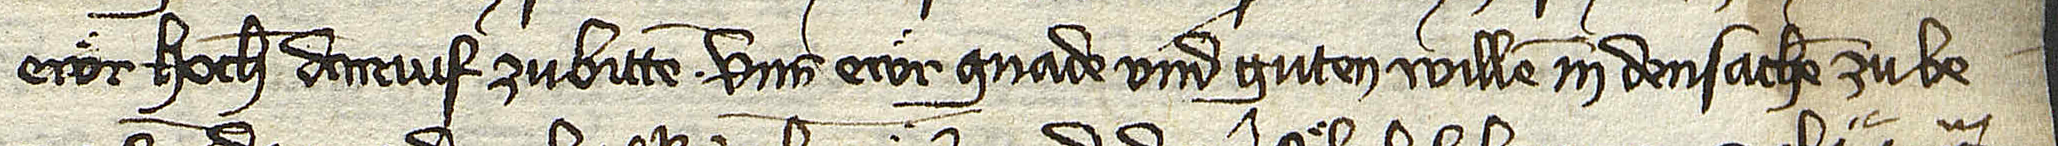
ewr Hoch* darauf ʒubitte* . Vns ewr gnade vnd guten wille* in den ſache* ʒu be -
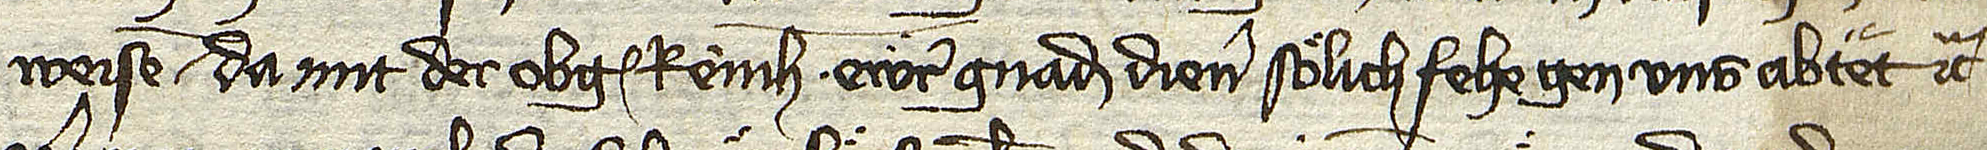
weiſe* / da mit der obg* Reinh* . ewr gnad* dien* ſölich fehe gen vns abtët ec*
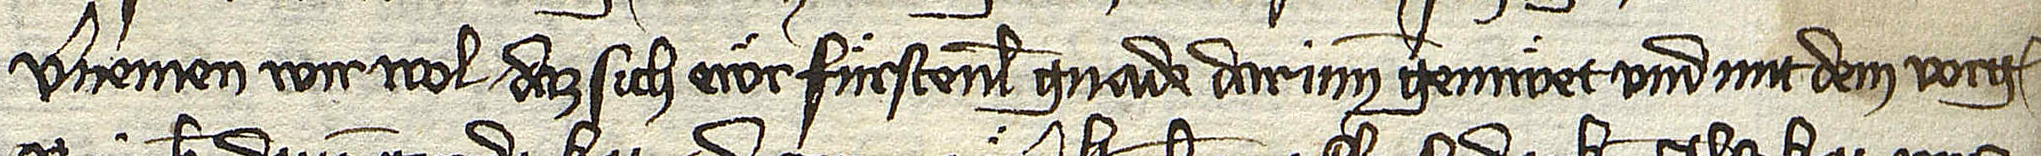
v*nemen wir wol / daʒ ſich ewr fürſtenl* gnade darinn* gemẅet vnd mit dem vorg*
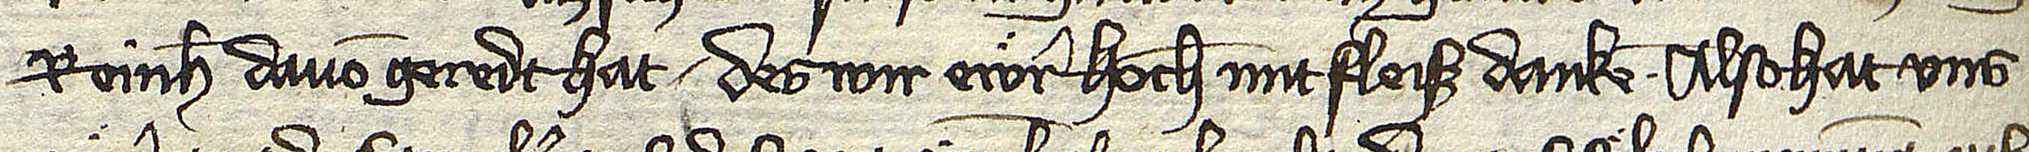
Reinh* dauo* geredt hat / Des wir ew*r Hoch* mit fleiſʒ danke* . Alſo hat vns
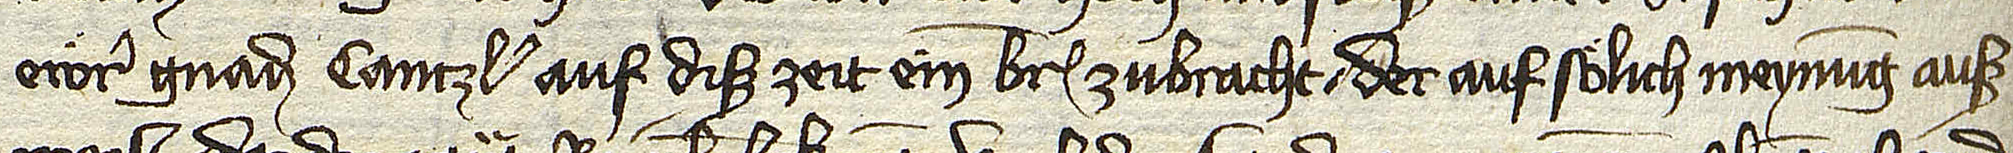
ewr* gnad* Cancʒl* auf diſʒ ʒeit ein br* ʒubracht / der auf ſölich meynu*g auſʒ
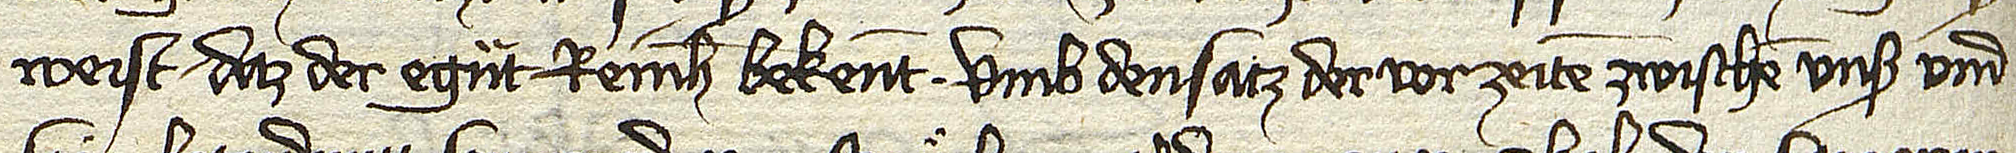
weiſt / daʒ der egn*t Reinh* bekent* . Vmb den ſacʒ der vor ʒeite* ʒwiſche* vnſ* vnd
